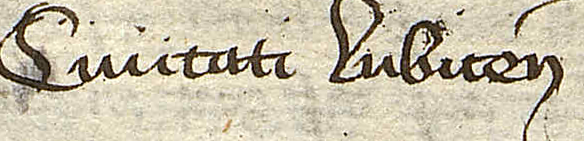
Ciuitati Lubicen*
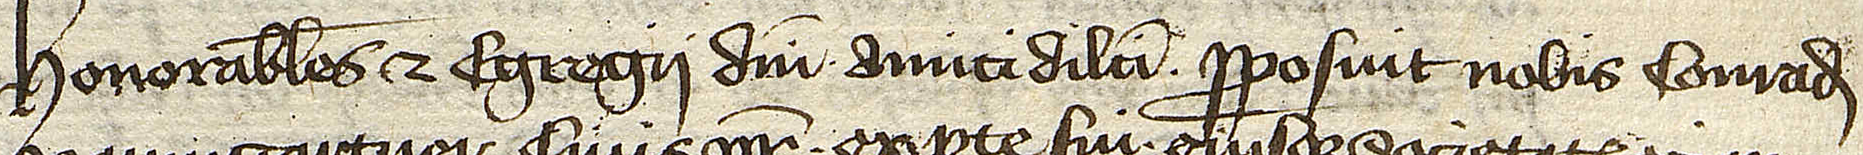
Honorabi*les @ Egregii d*ni Amici dil*c*i . P*poſuit nobis Conrad*
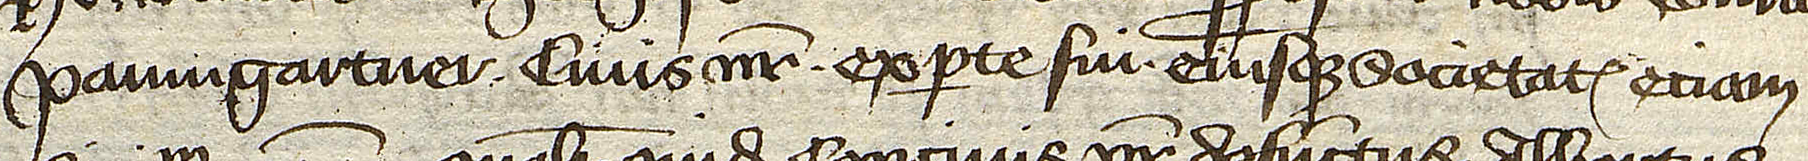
Paumgartner . Ciuis n*r . exp*te ſui eiuſq* Societat* etiam
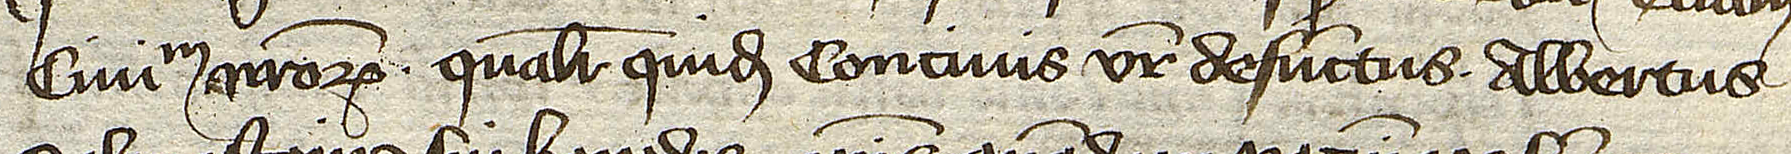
Ciui*m n*ro* . qual*r quid* Conciuis v*r defun*ctus . Albertus
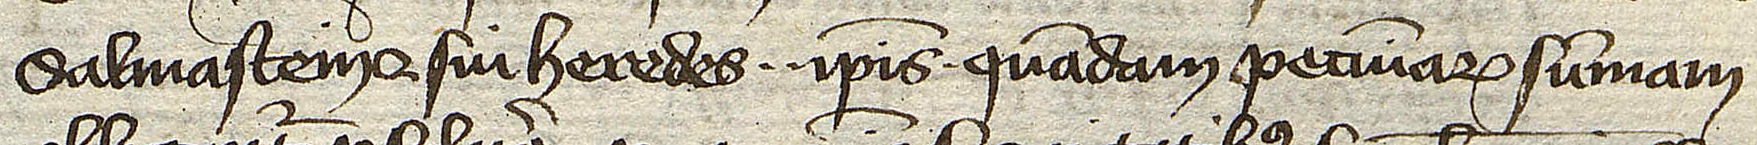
Salmaſtein @ ſui heredes ~ ip*is qua*dam pecu*ia* ſu*mam
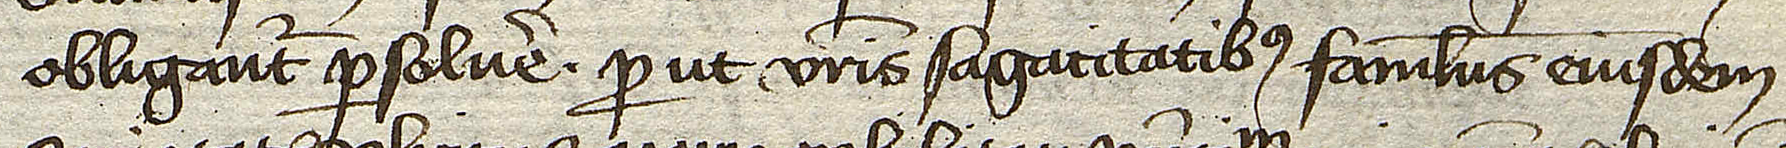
obligant* p*ſolue* . p*ut v*ris ſagacitatib* fam*lus eiuſdem
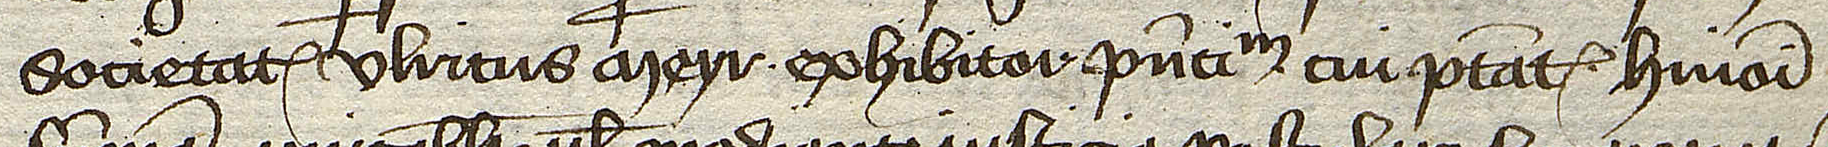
Societat* Vlricus Meyr . exhibitor p*nci* cui p*t*at* hui*o*i
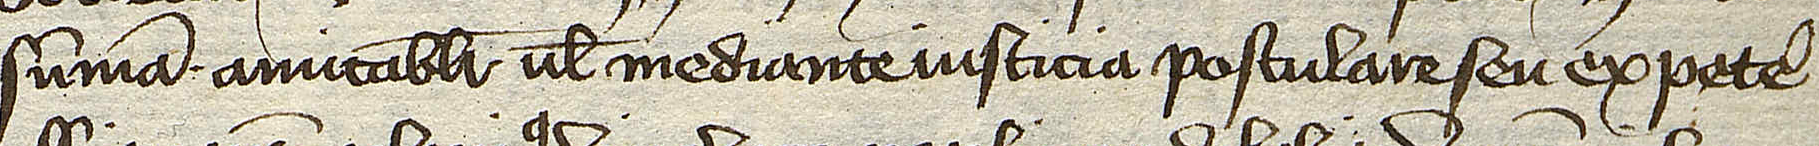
ſu*ma* . amicab*l*r u*l mediante iuſticia poſtulare ſeu expete*
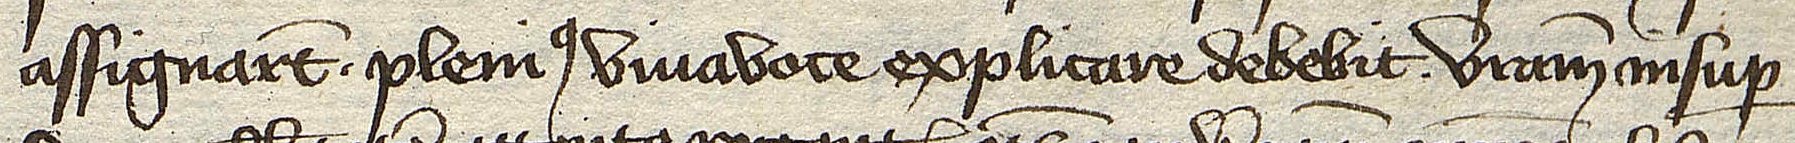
aſſignar*t* . pleni* viua voce explicare debebit . V*ram inſup*
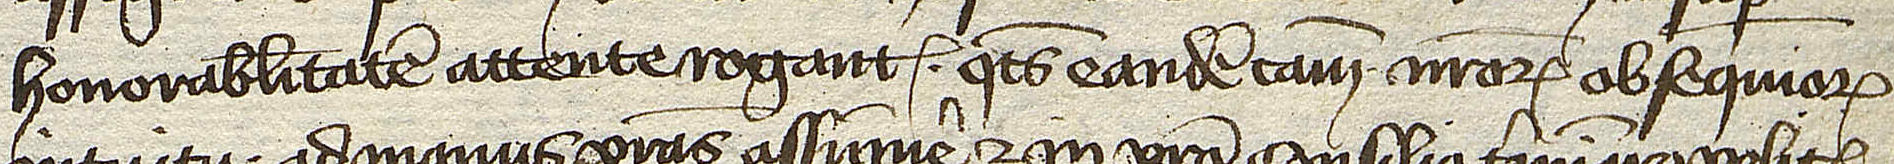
honorab*litate* attente rogan* . q*t*s eande* c*am n*ro* obſequio*
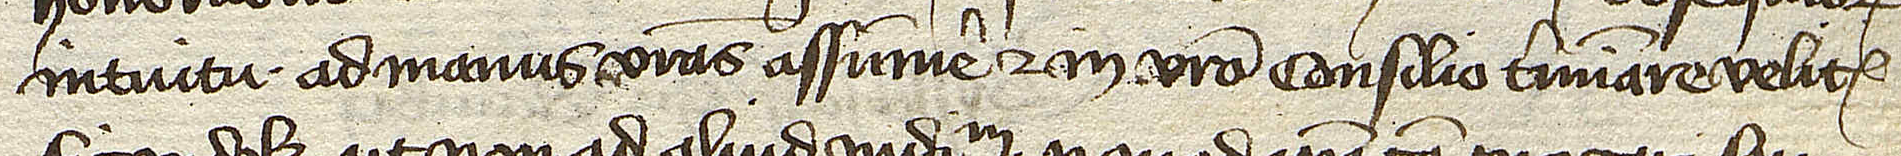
intuitu . ad manus v*ras aſſu*me* @ in v*ro Conſilio t*mi*are velit*
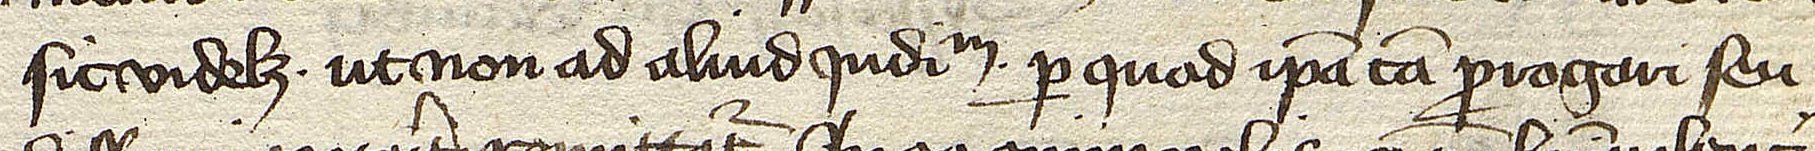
ſic videl* . ut non ad aliud Iudi* . p* quod ip*a c*a p*rogari ſeu
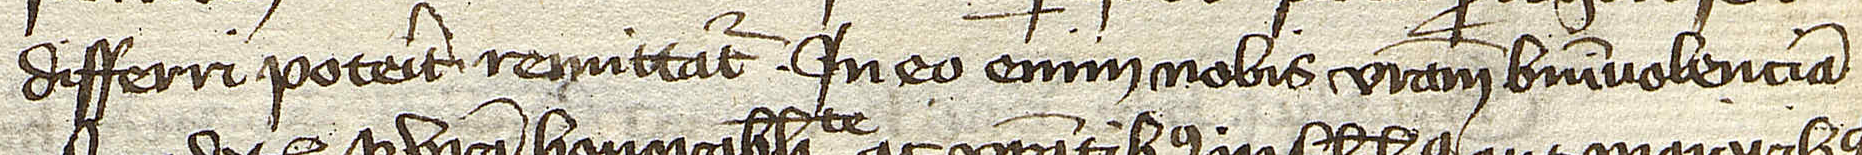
differri pote*it remittat* . In eo enim nobis v*ram b*niuolencia*
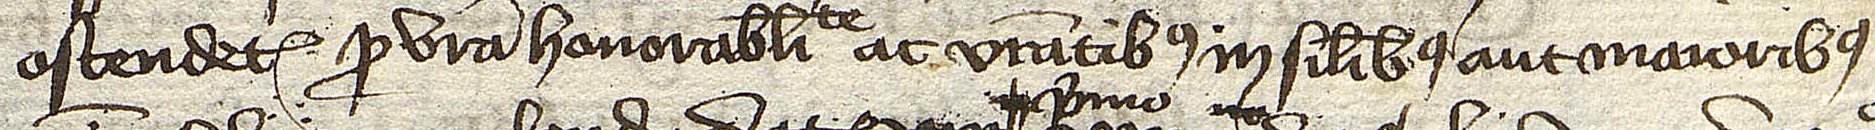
oſtendet* p* v*ra honorab*li* ac v*racib* in ſi*lib* aut maiorib*
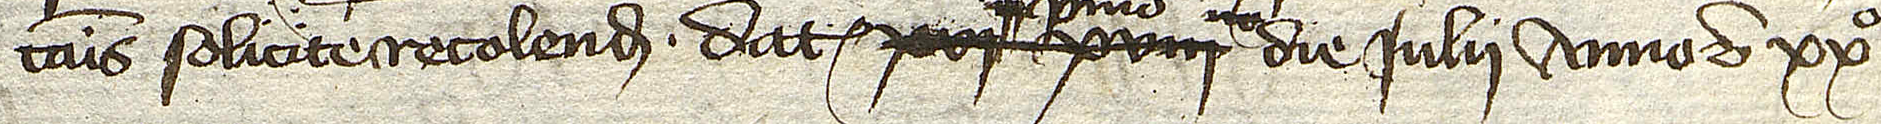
ca*is ſolicite recolend* . Dat* xvi xviii* die Iulii Anno ec* xx*
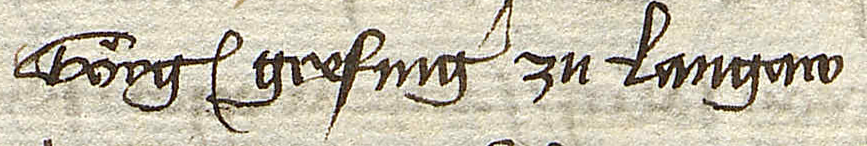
Görg* grefing* ʒu Langaw
